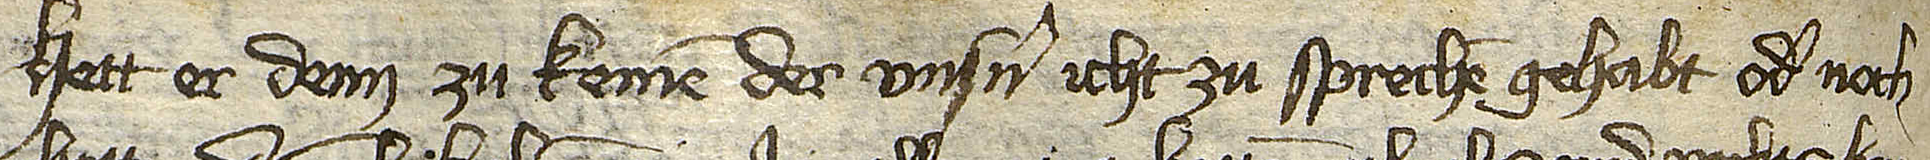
Hett er denn ʒu keine* der vnſn* icht ʒu ſpreche* gehabt od* noch
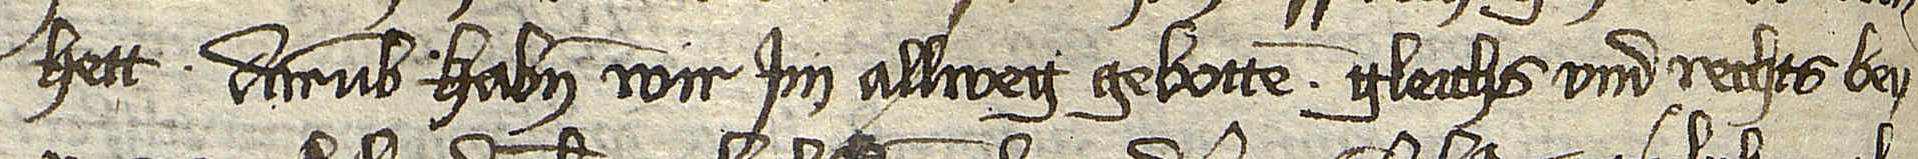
hett . Darub* habn* wir Im allweg gebotte* . gleichs vnd rechts bey
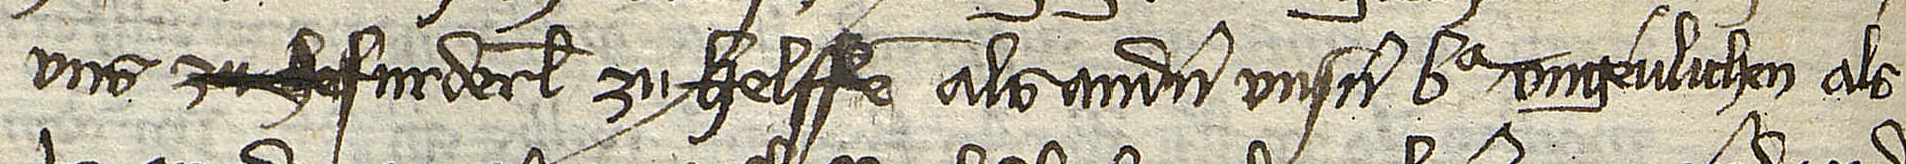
vns ʒu he furderl* ʒu helffe* als andn* vnſn* b* vngeu*lichen als
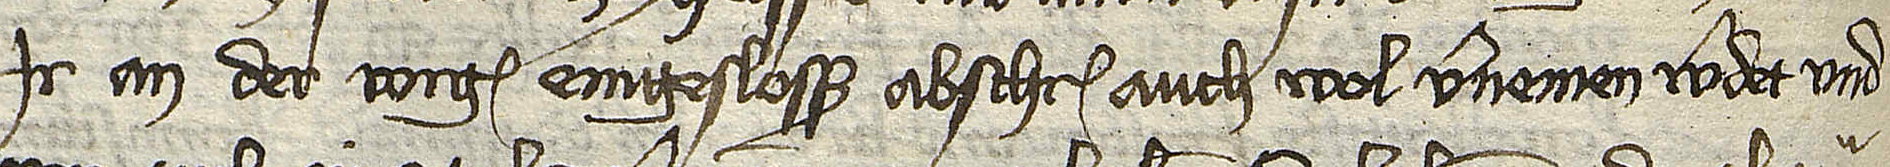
Ir an der vorg* eingeſloſſ* abſchr* auch wol v*nemen w*det vnd
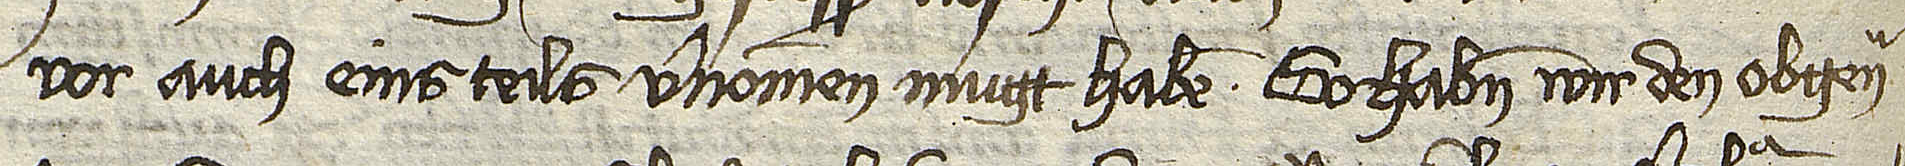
vor auch eins teils v*nomen mugt habe* . So habn* wir den obgen*
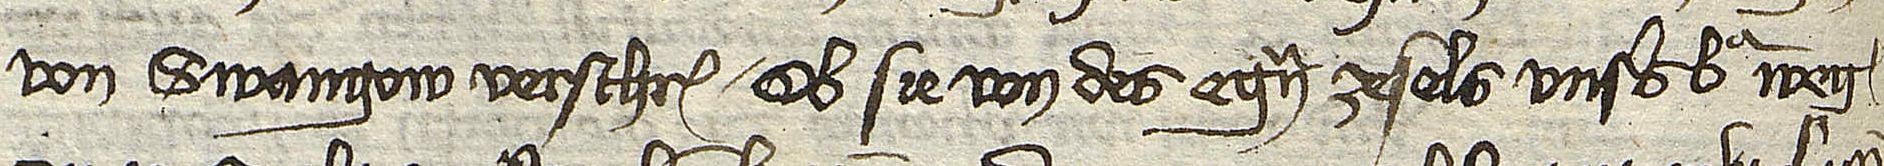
von Swangow verſchr* / Ob ſie von des egn* ʒeſels vnſ*s b* weg*
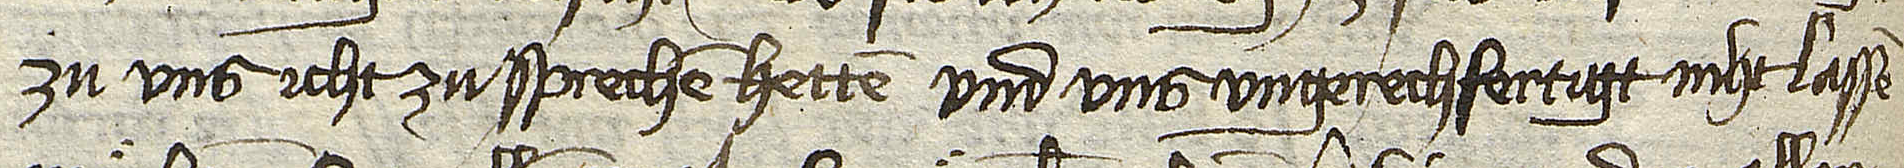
ʒu vns icht ʒu ſpreche* hette* vnd vns vngerechfertigt niht laſſe*
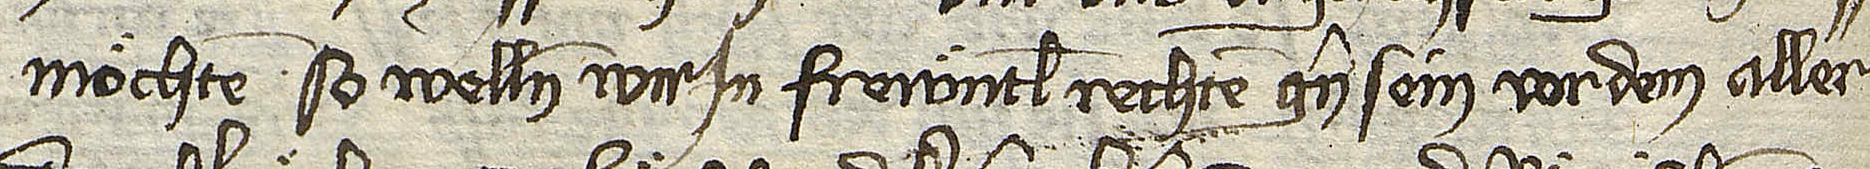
möchte* . ſo welln* wir In freẅntl* rechte* g*n ſein vor dem aller
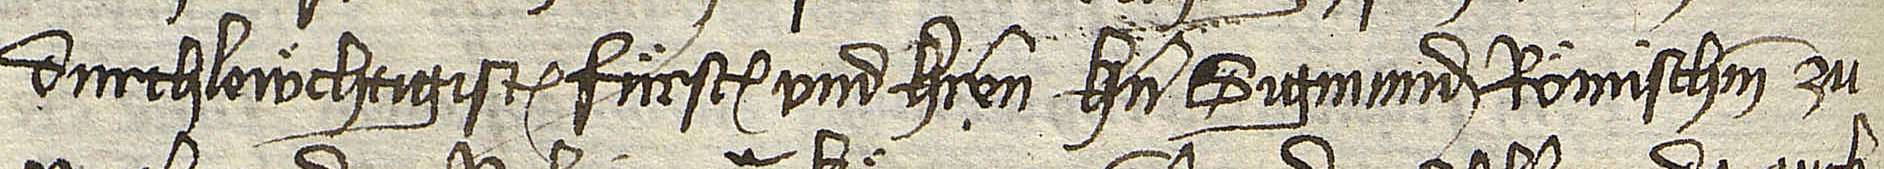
durchleẅchtigiſt* fürſt* vnd h*ren hn* Sigmund* Römiſchm* ʒu
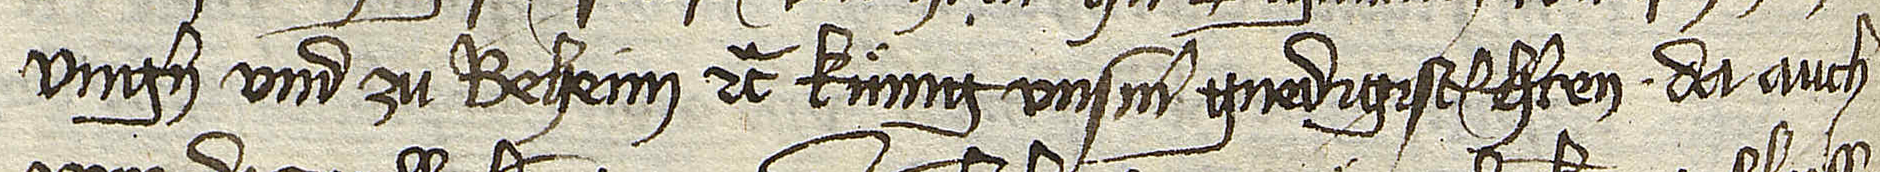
Vng*n vnd ʒu Beheim ec* künig vnſm* gnedigiſt* h*ren . da auch
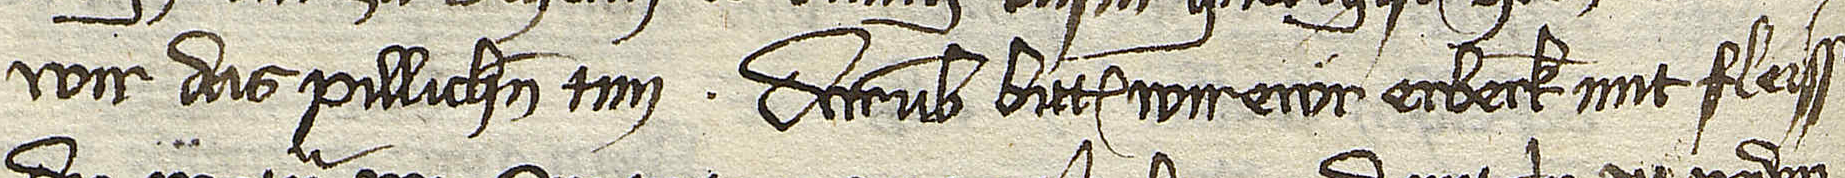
wir das pillichn* tun . Darub* bitt* wir eẅr erberk* mit fleiſſ
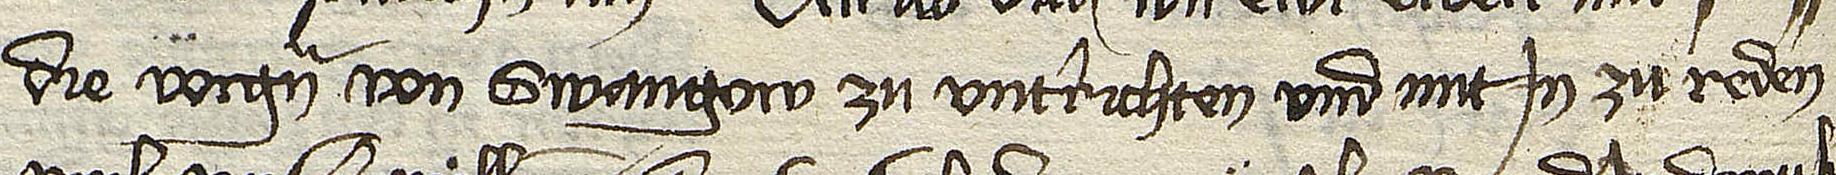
die vorgn* von Swangow ʒu vnt*richten vnd mit In ʒu reden
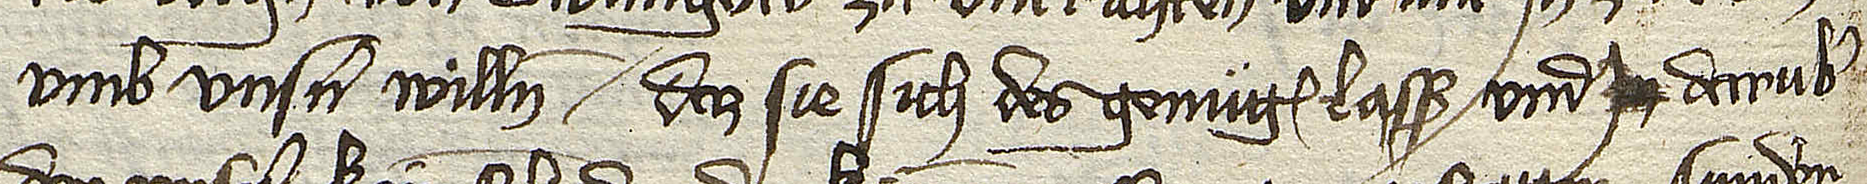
vmb vnſn* willn* / Daʒ ſie ſich des genüg* laſſ* vnd In darub*
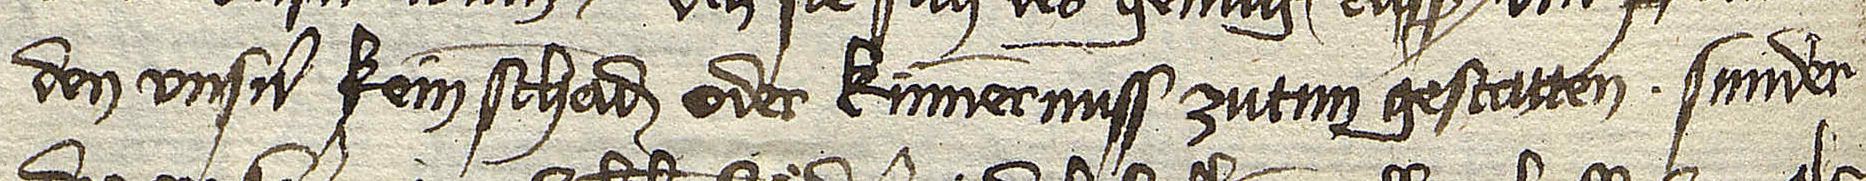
den vnſn* kein* ſchad* oder küm*ernuſſ ʒutun geſtatten . ſunder
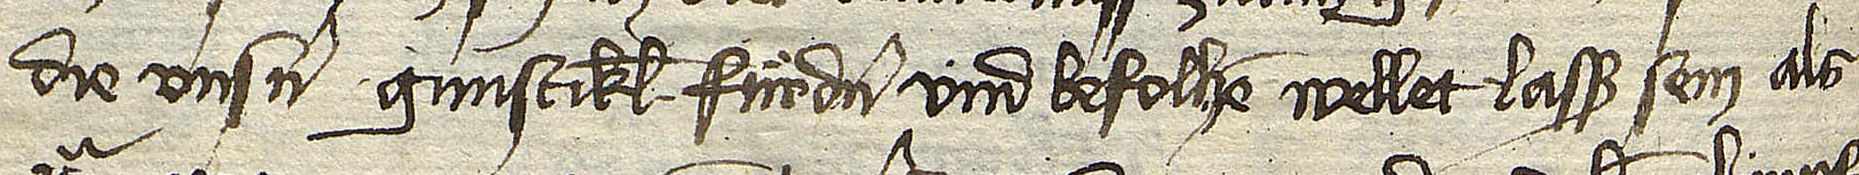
die vnſn* gunſtikl* fürdn* vnd befolhe* wellet laſſ* ſein als
